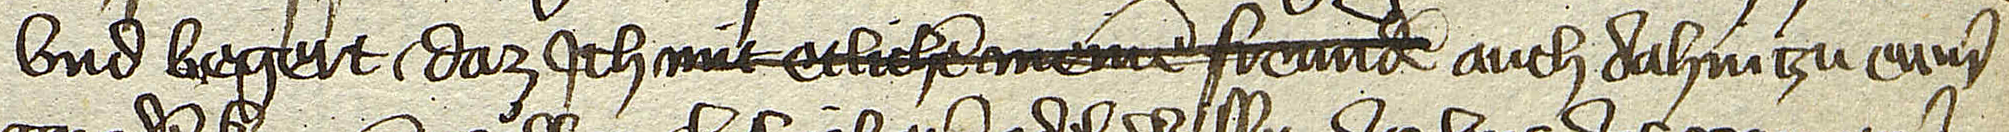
vnd begert / daʒ Ich mit etliche* meine* freunde* auch dahincʒu ewn*
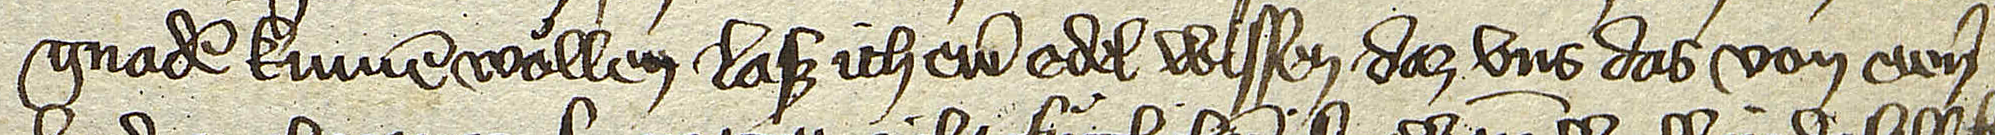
gnad* kume* wöllen laſʒ ich ew* edel wiſſen / daʒ vns das von ewn*
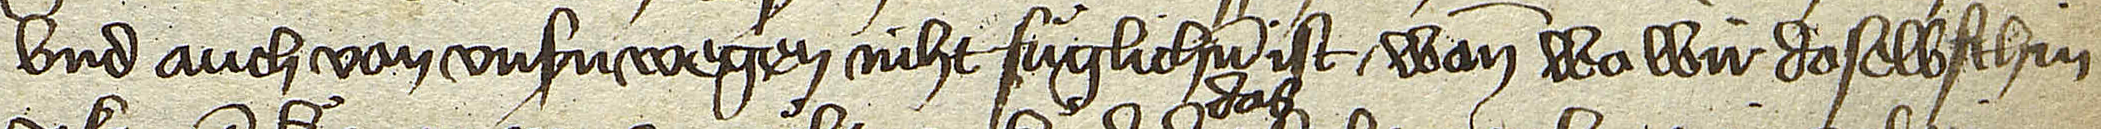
vnd auch von vnſ*n wegen niht füglichn* iſt / wan* wo wir doſelbſthin
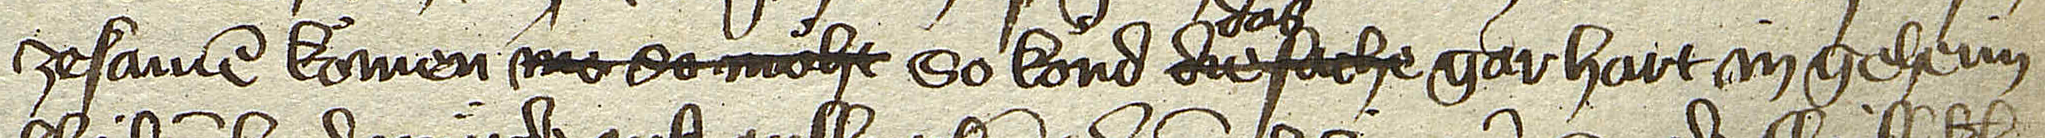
cʒeſame* kömen mo so möht So könd die ſache gar hart in geheim
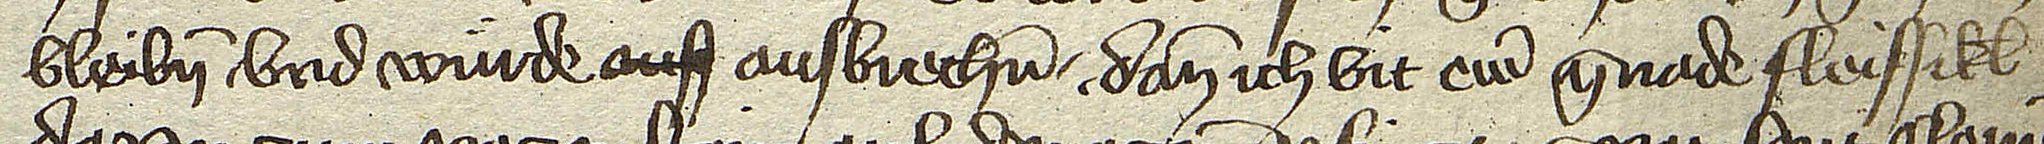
bleibn* / vnd würde auſʒ auſbrechn* / dan* ich bit ew* gnade fleiſſikl*
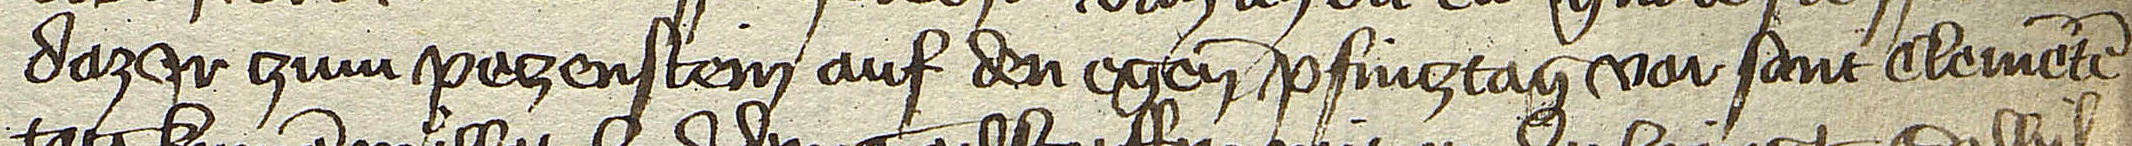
daʒ Ir cʒum pecʒenſtein auf den egen* pfincʒtag vor ſant Cleme*te*
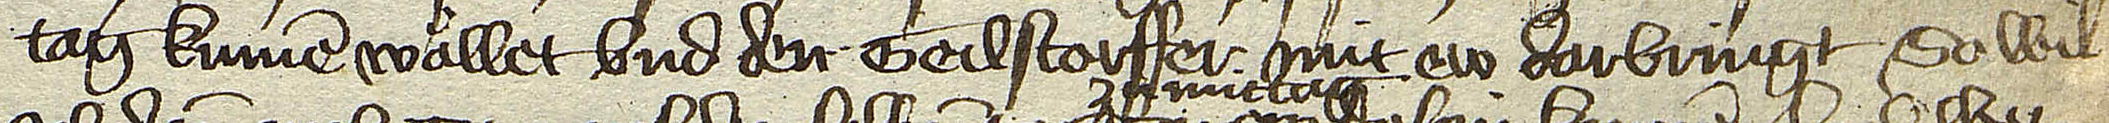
tag kume* wöllet vnd den Geilſtorffer mit ew darbringt / So wil
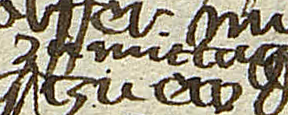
ʒu mittag
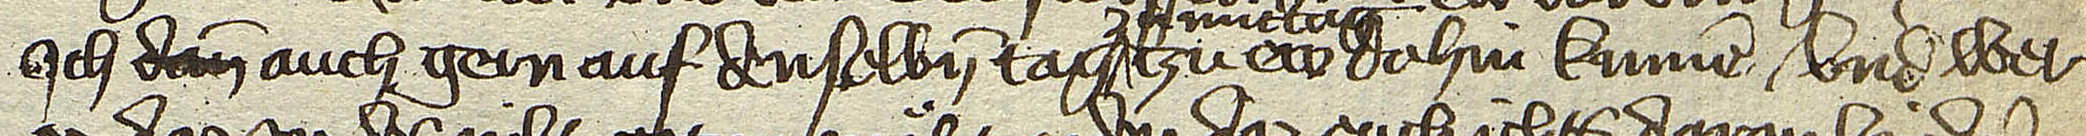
Ich dan* auch gern auf denſelbn* tag cʒu ew dohin kume* / vnd wer
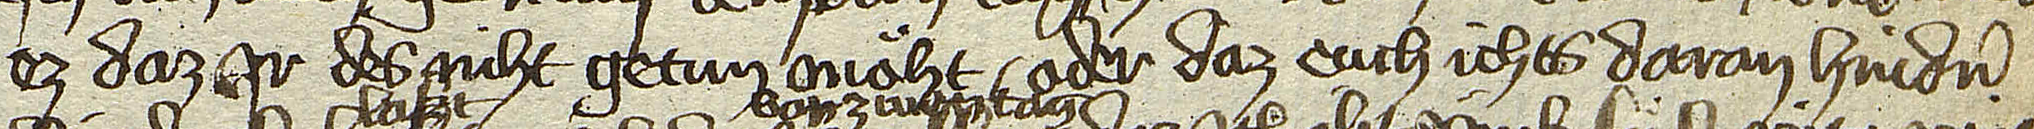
eʒ daʒ Ir des niht getun möht / oder daʒ euch ichts daran hindn*
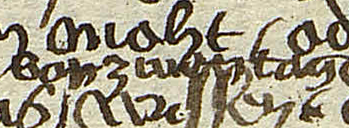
von ʒw%%tag
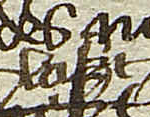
laſʒt
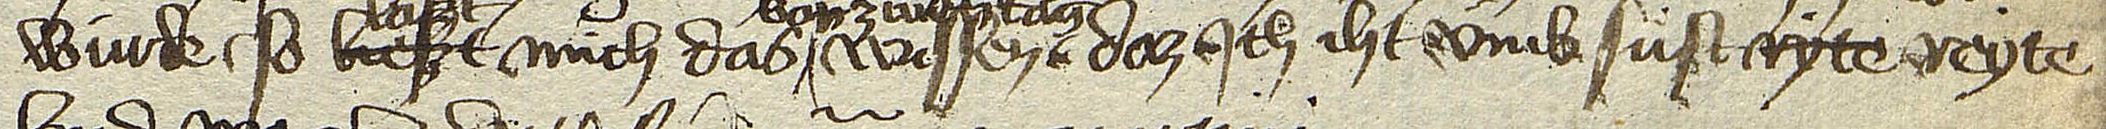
würde / ſo lieſʒt mich das wiſſen / daʒ Ich iht vmb ſüſt ryte reyte
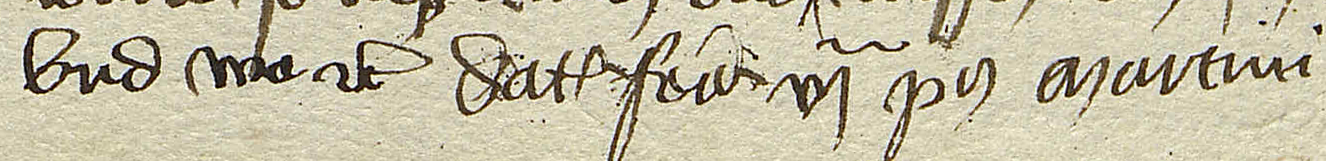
vnd wo ec* dat* fea* vi* p* Martini
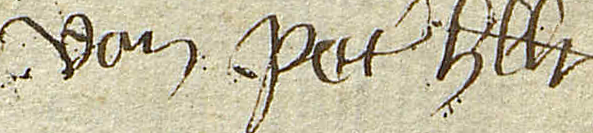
von Pet* hllr*
